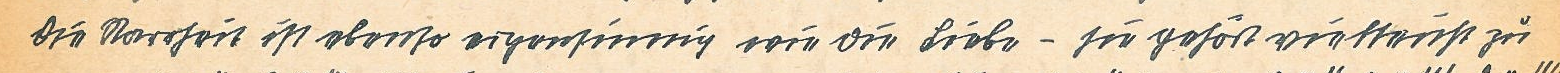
nur zu Dir — die Narrheit ist ebenso eigensinnig wie die Liebe — sie gehört vielleicht zu
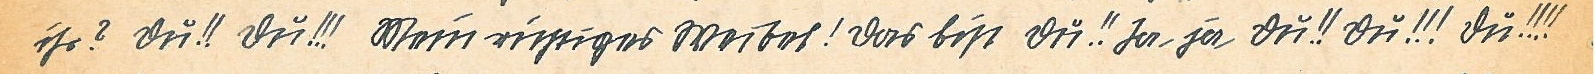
ihr? Du!! Du!!! Mein richtiges Weibel! Das bist Du!! Ja, ja, Du!! Du!!! Du!!!!
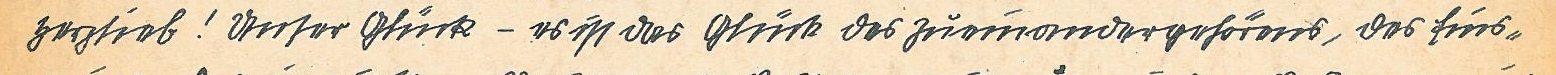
Herzlieb! Unser Glück — es ist das Glück des Zueinandergehörens, des Eins¬
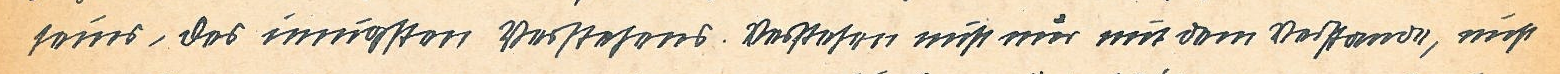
seins, des innigen Verstehens. Verstehen nicht nur mit dem Verstande, nicht
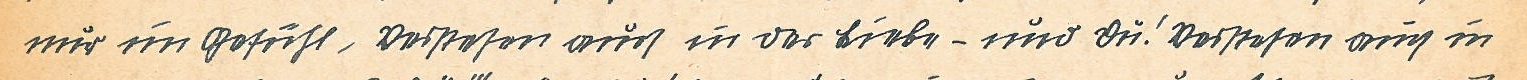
nur im Gefühl, Verstehen auch in der Liebe — und Du! Verstehen auch in
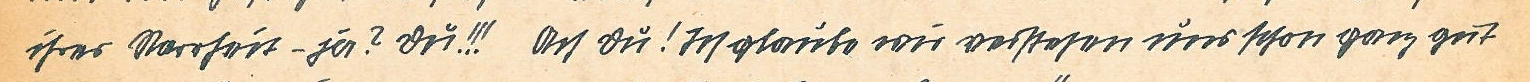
ihrer Narrheit — ja? Du!!! Ach Du! Ich glaube wir verstehen uns schon ganz gut
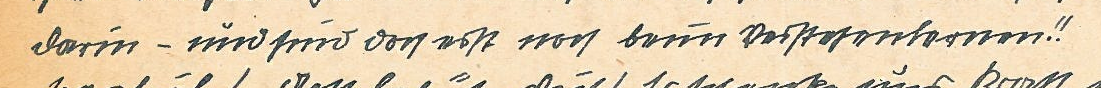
darin — und sind doch erst noch beim Verstehenlernen!!
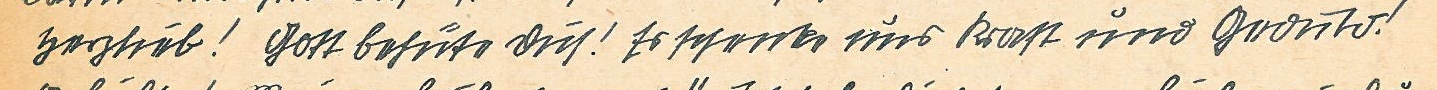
Herzlieb! Gott behüte Dich! Er schenke uns Kraft und Geduld!
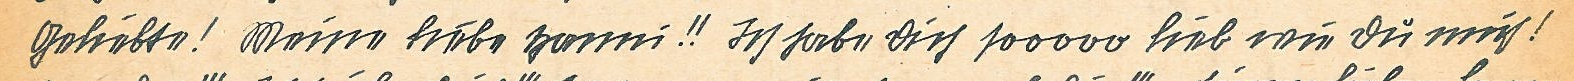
Geliebte! Meine liebe !! Ich habe Dich sooooo lieb wie Du mich!
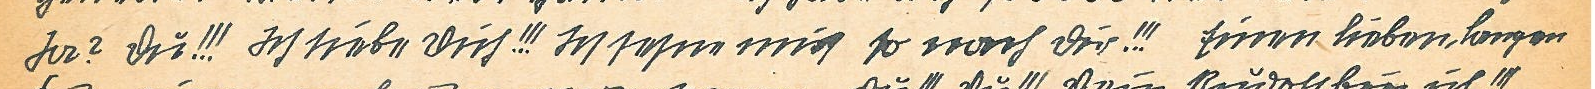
Ja? Du!!! Ich liebe Dich!!! Ich sehne mich so nach Dir!!! Einen lieben, langen
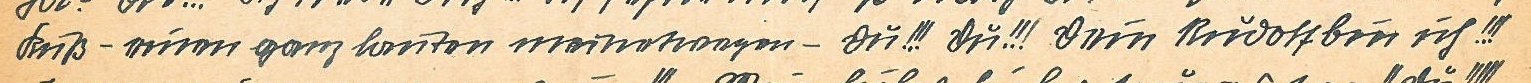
Kuß — einen ganz lauten meinetwegen — Du!!! Du!!! Dein bin ich!!!
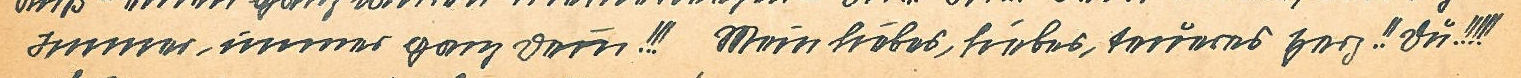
Immer, immer ganz Dein!!! Mein liebes, liebes, teures Herz!! Du!!!!!
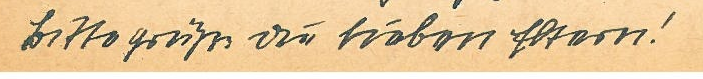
Bitte grüße Deine lieben Eltern!
